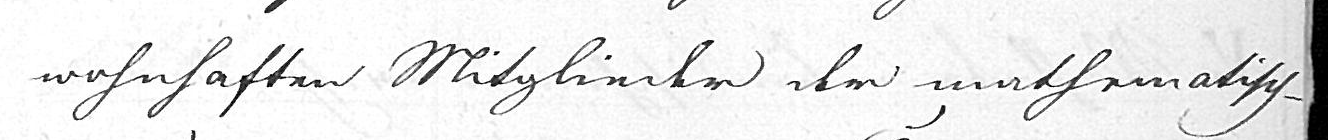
wohnhaften Mitgleider der mathematisch-
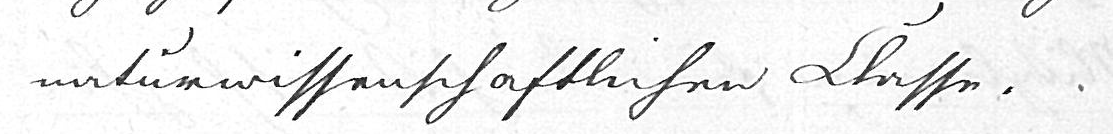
naturwissenschaftlichen Classe.
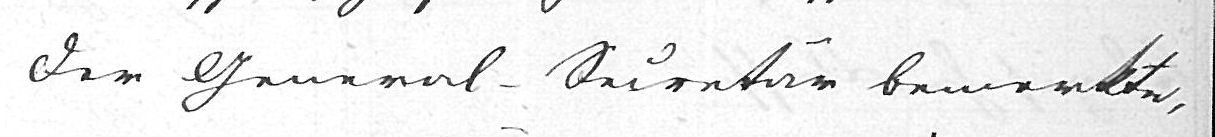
Der General-Secretär bemerkte,
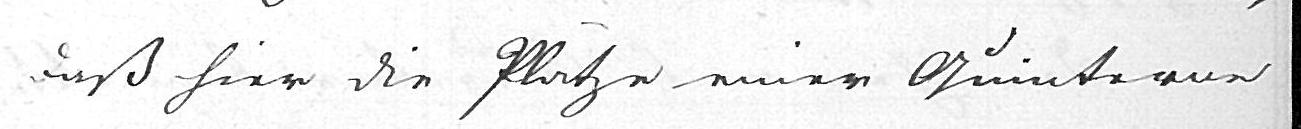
daß hier die Plätze einer Quinterne
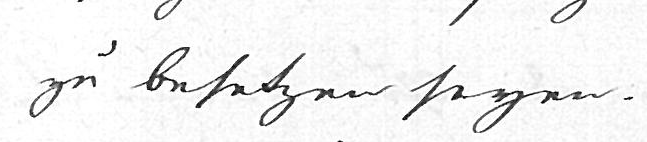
zu besetzen seyen.
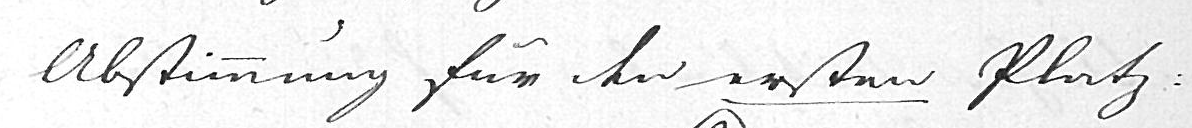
Abstimmung für den ersten Platz:
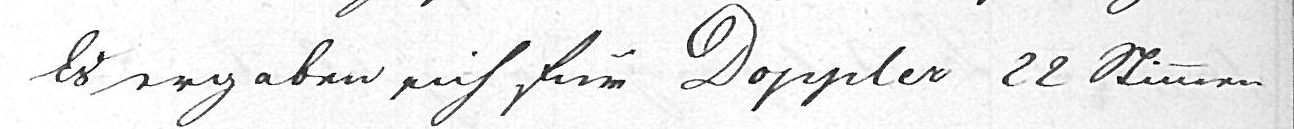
Es ergaben sich für Doppler 22 Stimmen
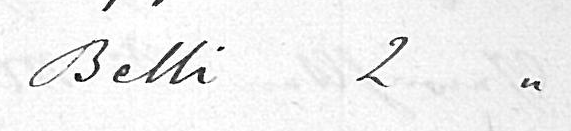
Belli 2 "
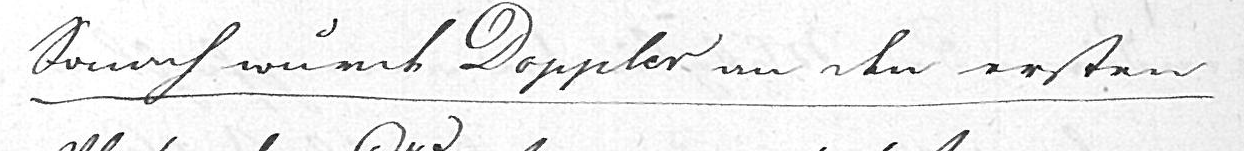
Sonach wurde Doppler an den ersten
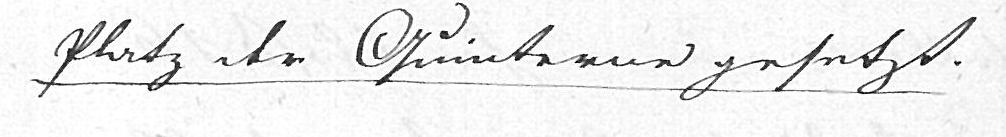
Platz der Quinterne gesetzt.
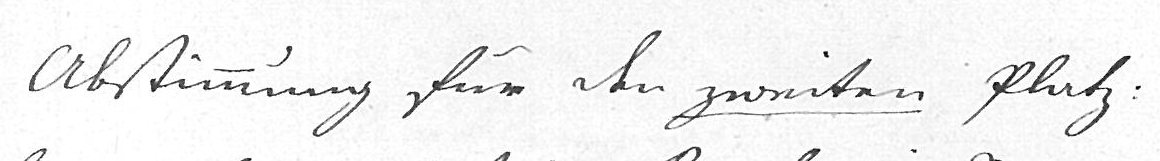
Abstimmung für den zweiten Platz:
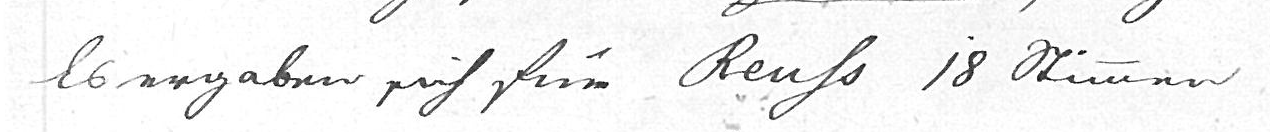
Es ergaben sich für Reuss 18 Stimmen
